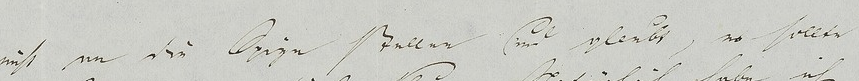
nicht an die Spize stellen und glaubt, es sollte
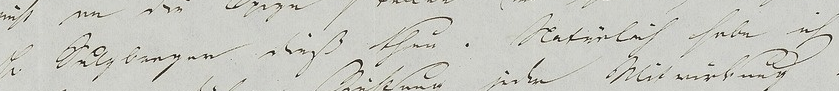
Hr Sulzberger dieß thun. Natürlich habe ich
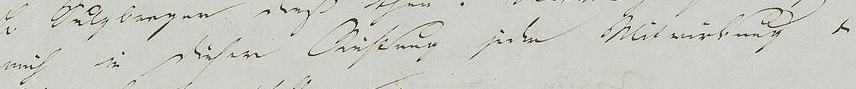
mich in dieser Richtung jeder Mitwirkung &
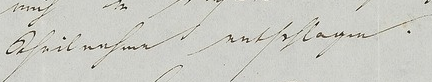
Theilnahme entschlagen.
